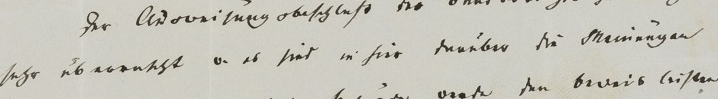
sehr überrascht &. es sind in hier darüber die Meinungen
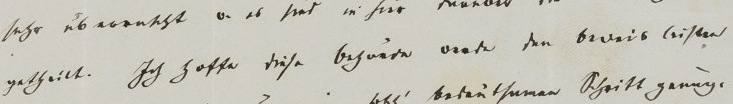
getheilt. Ich hoffe diese Behörde werde den Beweis leisten
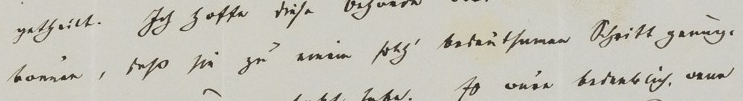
können, daß sie zu einem solch' bedeutsamen Schritt genug-
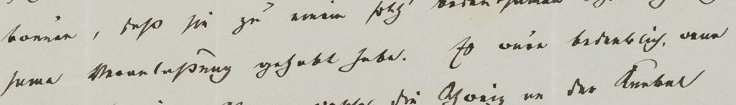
same Veranlaßung gehabt habe. Es wäre bedenklich, wenn
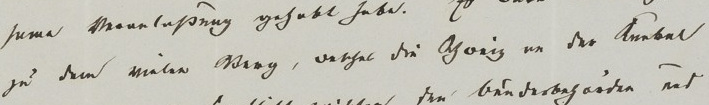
zu dem vielen Werg, welches die Schweiz an der Kunkel
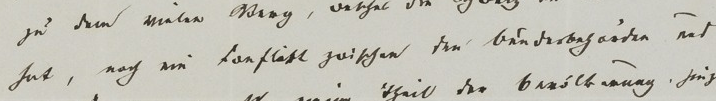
hat, noch ein Konflikt zwischen den Bundesbehörden und
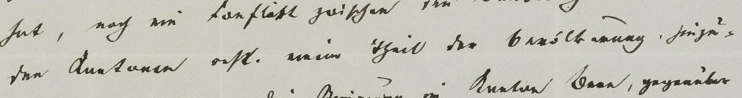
den Kantonen resp. einem Theil der Bevölkerung hinzu-
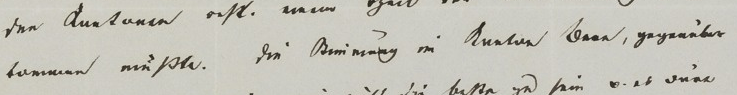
kommen müßte. Die Stimmung im Kanton Bern, gegenüber
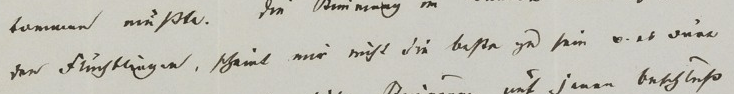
den Flüchtlingen, scheint mir nicht die beste zu sein &. es wäre
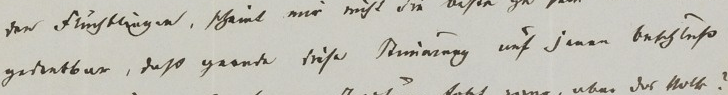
gedenkbar, daß gerade diese Stimmung auf jenen Beschluß
